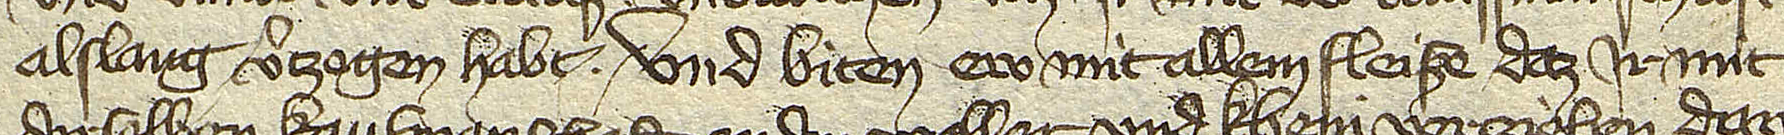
alſlang v*cʒogen habt / Vnd biten ew mit allem fleiſʒe / daʒ Ir mit
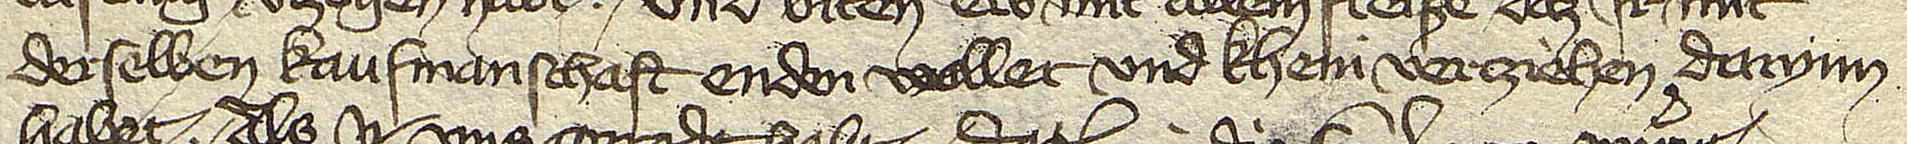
derſelben kaufmanſchaft enden wollet vnd khein vercʒiehen darynn
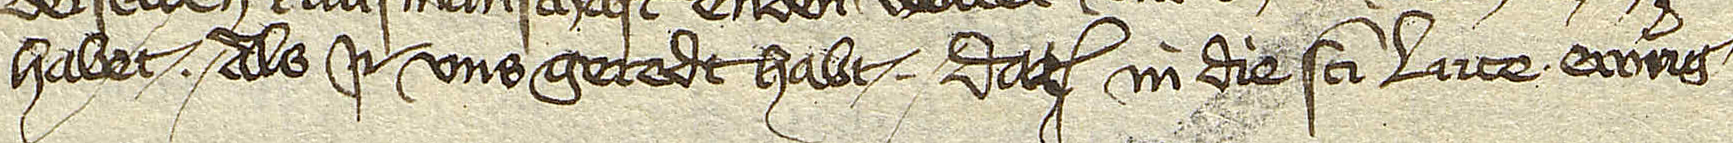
habet . / Als Ir vns geredt habt . / Dat* in die ſci* Luce ewag*
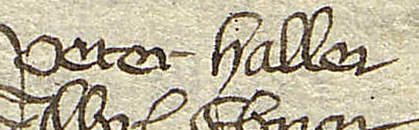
Peter haller
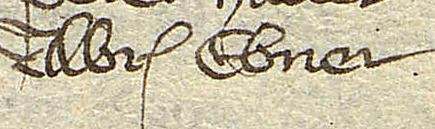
Albr* Ebner
